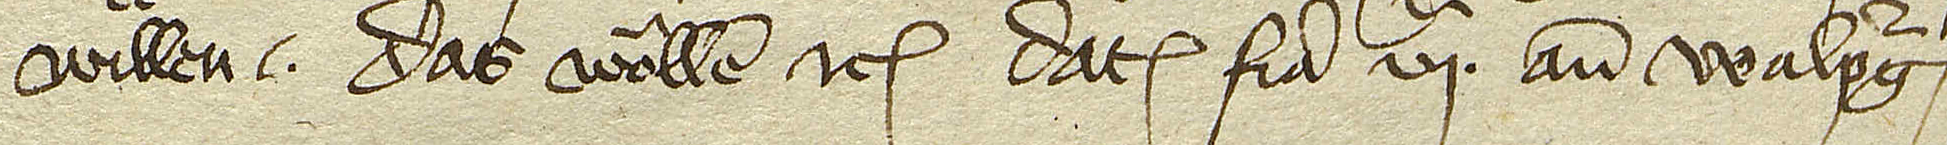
willen / . Das wölle* ec* dat* fia* vi* . an* walp*g*
